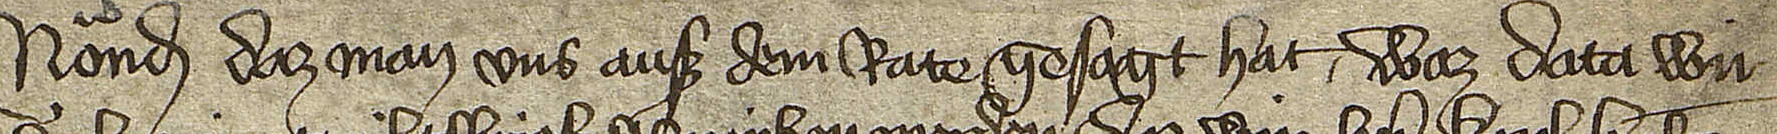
Nond* daʒ man vns auſʒ dem Rate geſagt hat / waʒ data wir
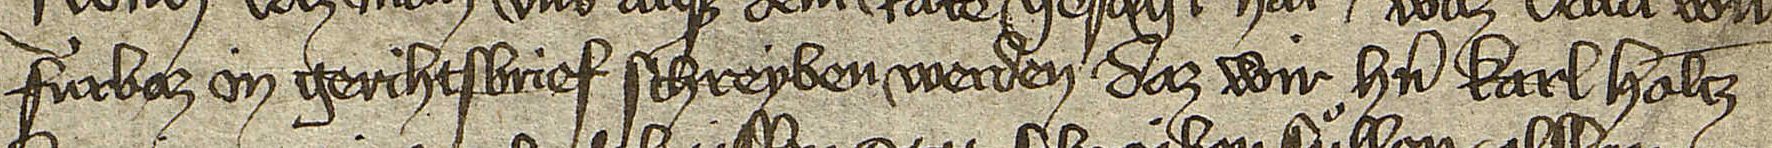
fürbaʒ in gerihtſbrief ſchreyben werden / daʒ wir hn* karl Holcʒ*
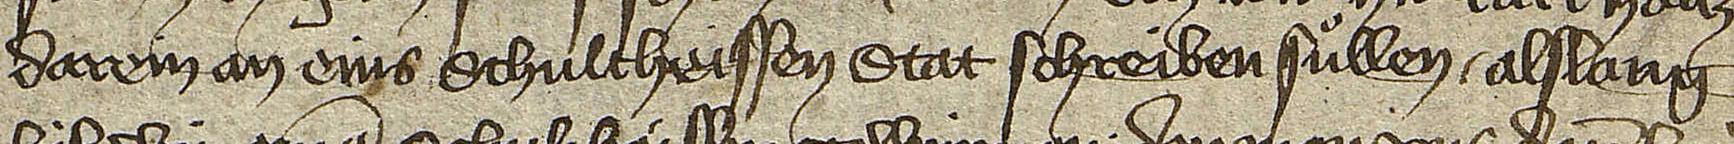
darein an eins Schultheiſſen Stat ſchreiben ſüllen / alſlang
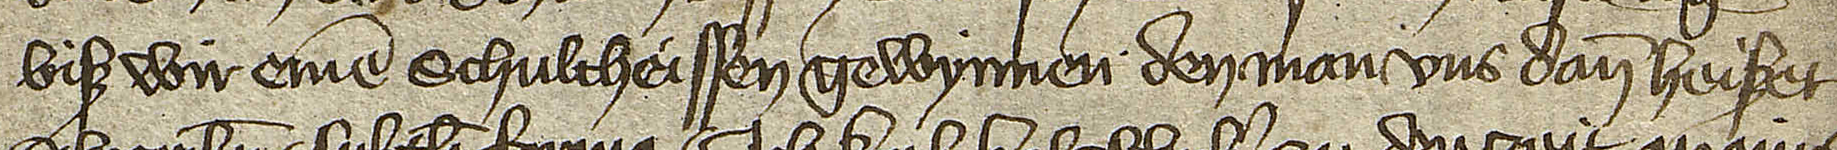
biſʒ wir eine* Schultheiſſen gewynnen . den man vns dan* heiſʒet
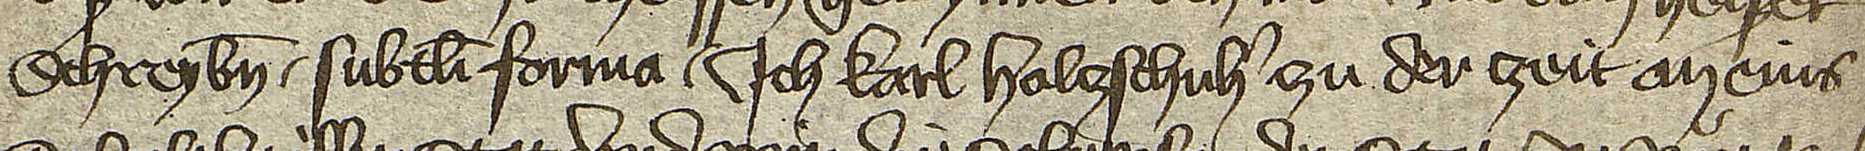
Schreybn* / ſubtli* forma / Ich karl Holcʒſchuh* cʒu der cʒeit Meins
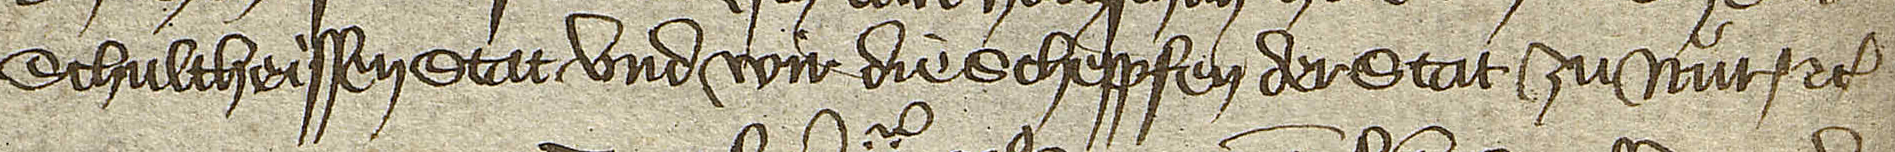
Schultheiſſen Stat / vnd wir die Scheppfen der Stat cʒu Nür* ec*
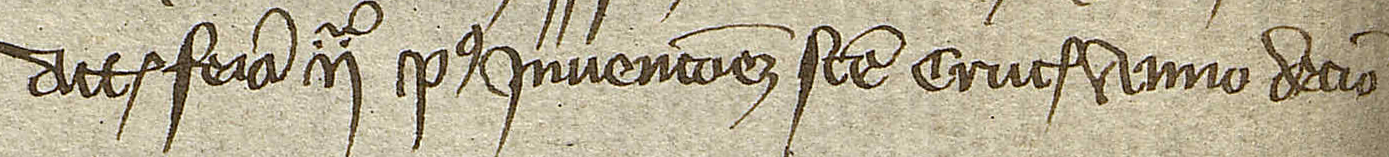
Act* feia* ii* p* Inuencoe* ſce* Cruc* Anno decio*
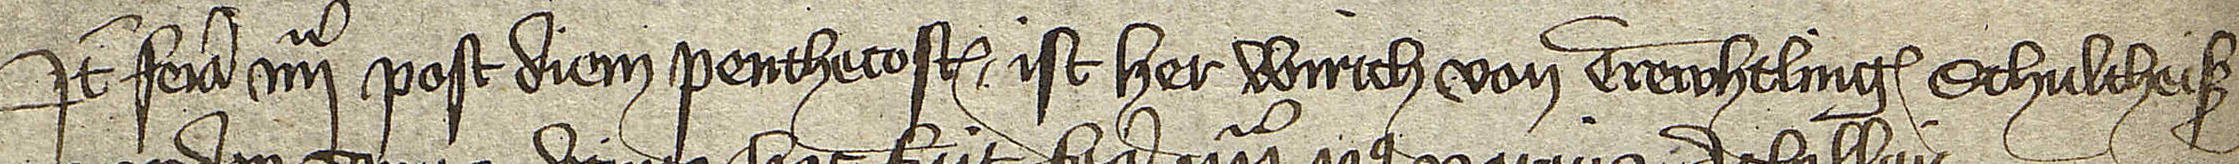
It* feia* iiii* poſt diem penthecoſt* / iſt her wirich von Trewchtling* Schultheiſʒ
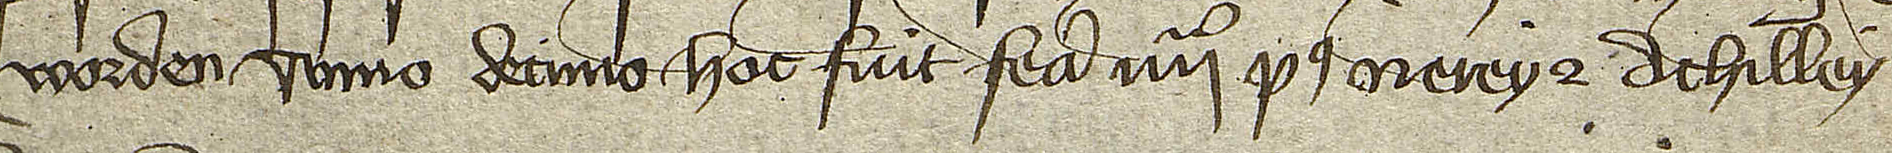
worden / Anno decimo / hoc fuit fea* iiii* p* Nerey @ Achilley
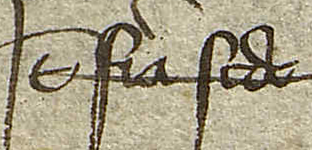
It fia* ſcd
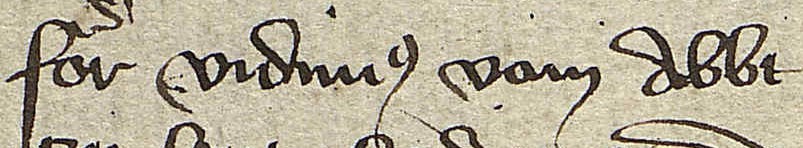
for* vidim* vom Abbt
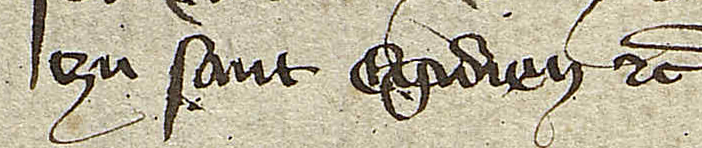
cʒ ſant Egidien ec*
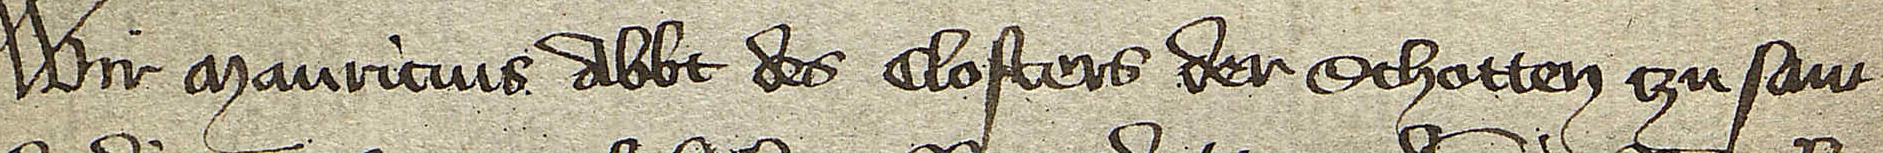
Wir Mauricius Abbt des Cloſters der Schotten cʒu ſant
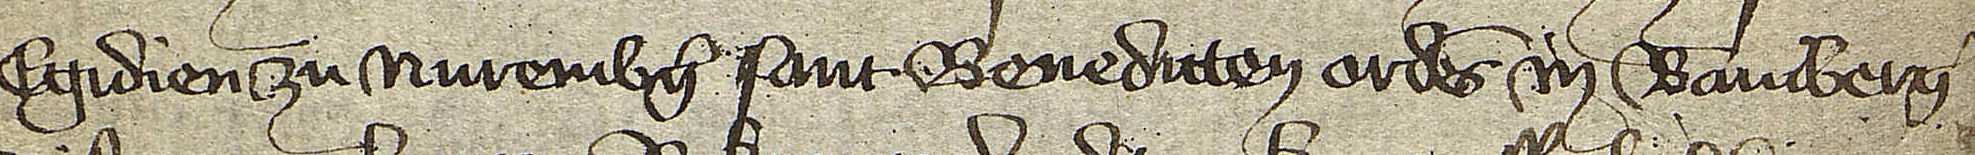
Egidien cʒu Nurembg* ſant Benedicten ordes* in Bamberg*
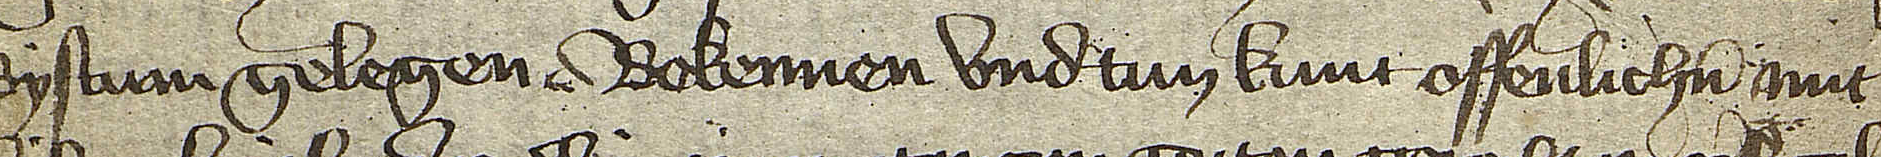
Byſtum gelegen / Bekennen vnd tun kunt offenlichn* mit
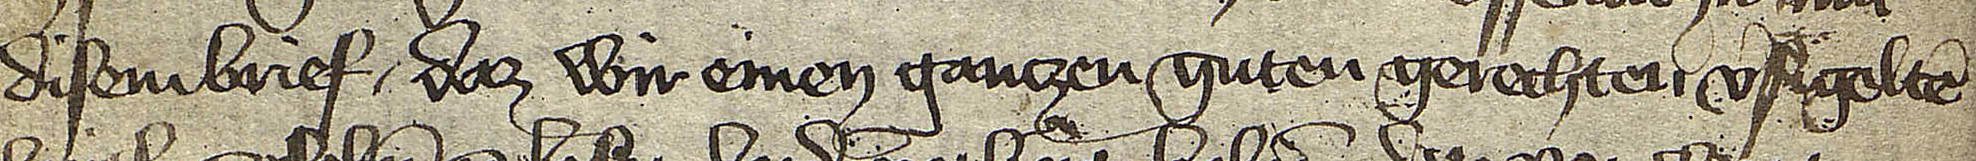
diſem brief / daʒ wir einen gancʒen guten gerechten v*ſigelte*
